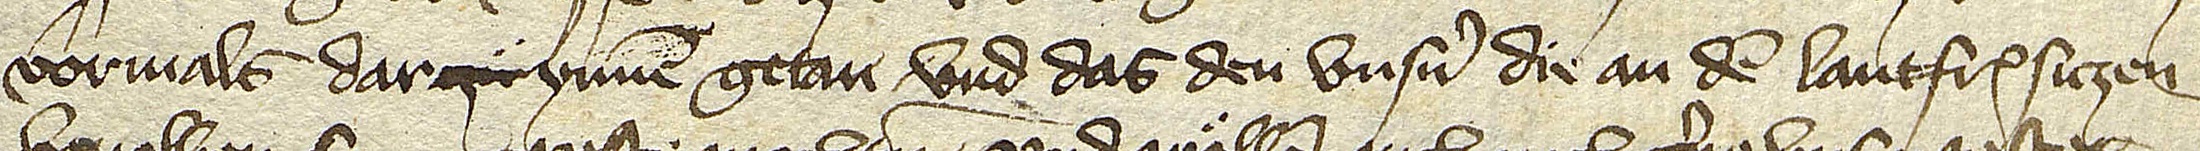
vormals darcʒür ynne* getan / vnd das den vnſn* die an d* lantfr* ſicʒen
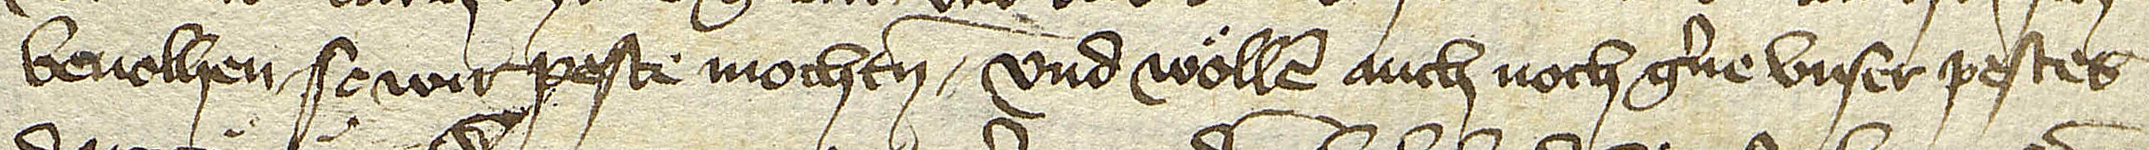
beuolhen / ſo wir peſte mochtn* / vnd wölle* auch noch g*ne vnſer peſtes
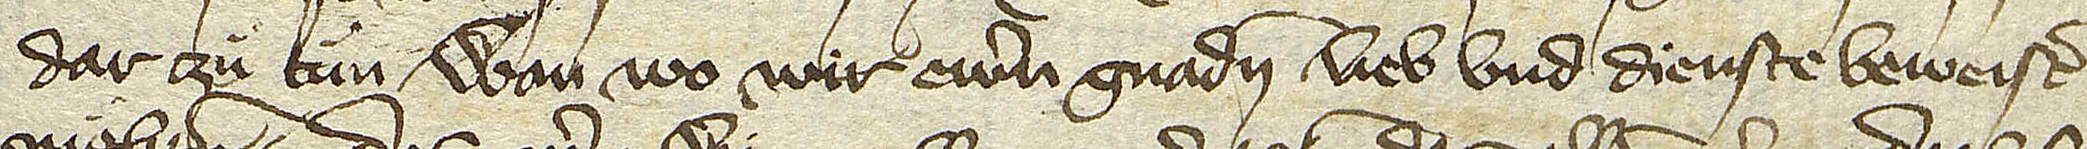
dar cʒü tün / Wan wo wir ew*n gnadn* / lieb vnd dienſte beweiſe*
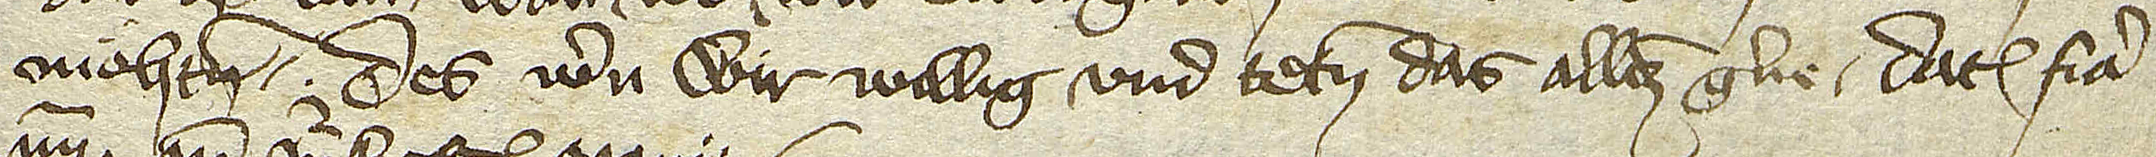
möhtn* /. Des w*n wir willig vnd tetn* das allcʒ* g*ne / Dat* fia*
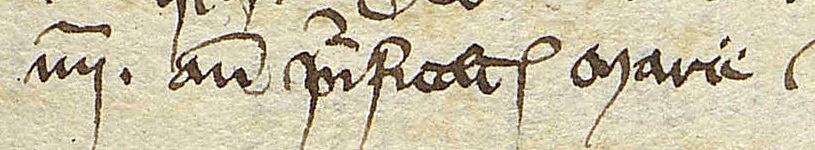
iiii* . an* p*rficac* Marie /
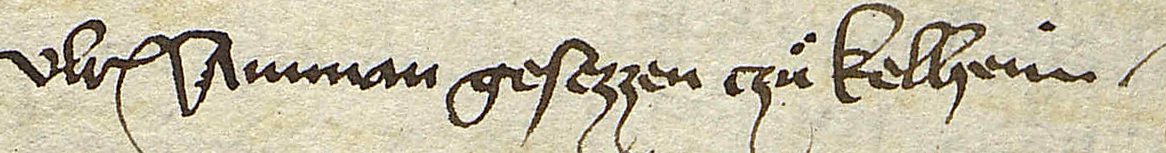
vlr* Amman geſeʒʒen cʒü kelheim /
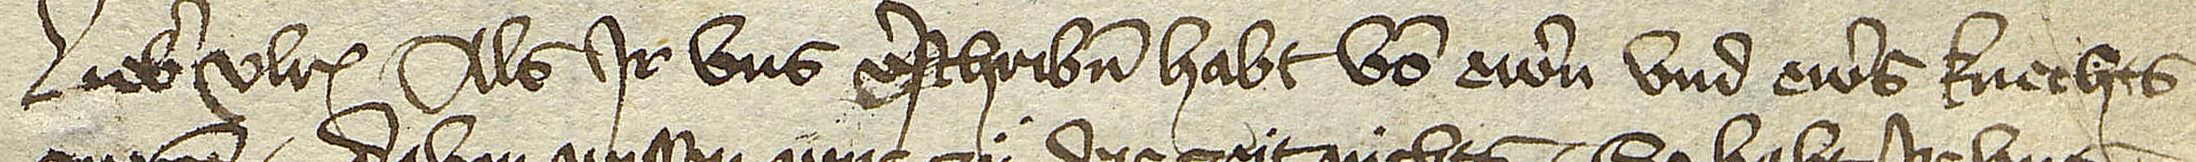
Lieb* vlr* / Als Ir vns v*ſchribn* habt vo* ewn* vnd ew*s knechts
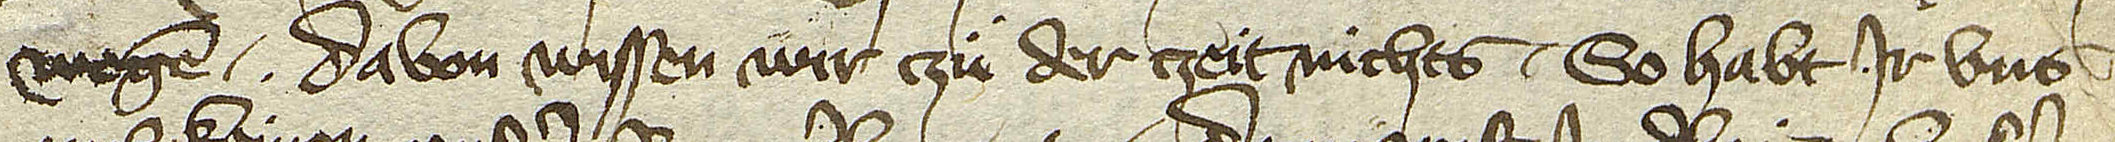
wege* /. Davon wiſſen wir cʒü der cʒeit nichts / So habt Ir vns
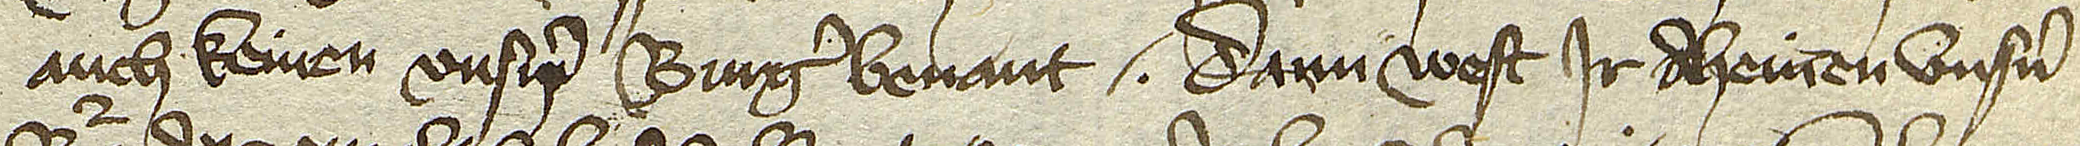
auch keinen vnſn* Burg* benant /. Dann weſt Ir dheinen vnſn*
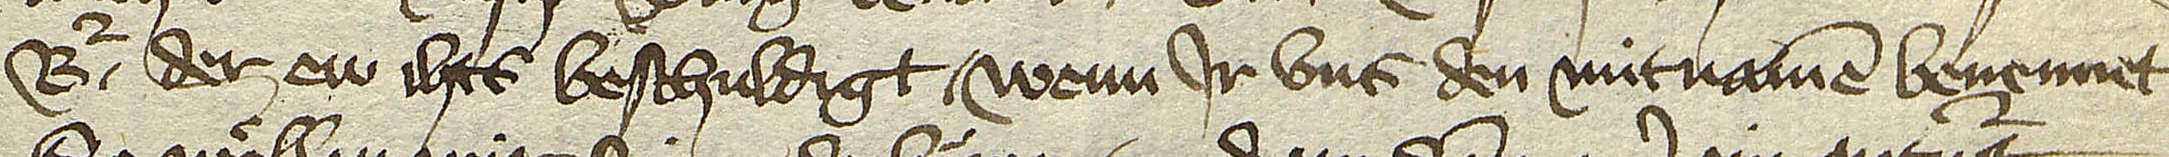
B* / der ew ihts beſchuldigt / wenn Ir vns den mitname* benennet
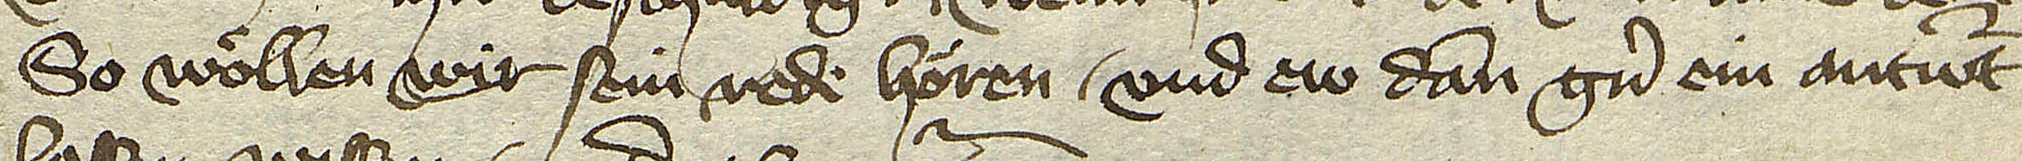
So wöllen wir ſein rede hören / vnd ew dan* gn* ein antw*t
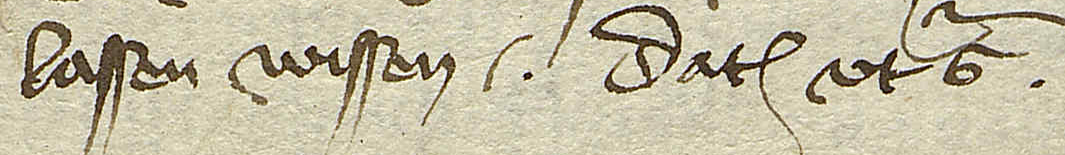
laſſen wiſſen / . Dat* vt s* .
